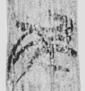民
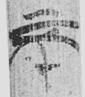不
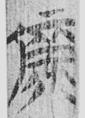備（服）
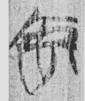安（焉）
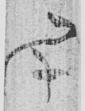氏（是）
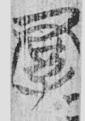君子
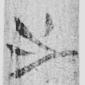之
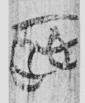恥
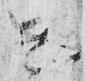也
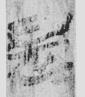是
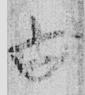古（故）
